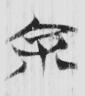余
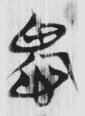{鬼心}
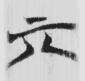亓
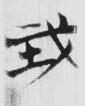{戈土}
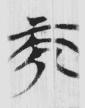而
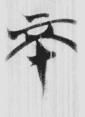不
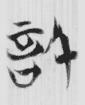信
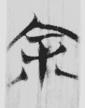余
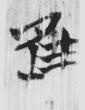隼
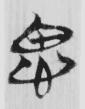思
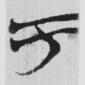于
